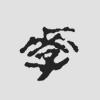李
